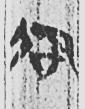卲
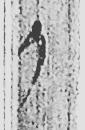人
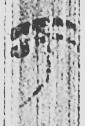于
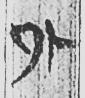外
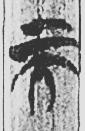而
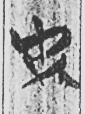𡚦
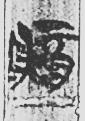𨟻
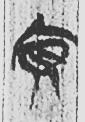{宀貝}
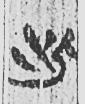此
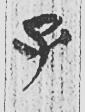子
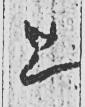也
